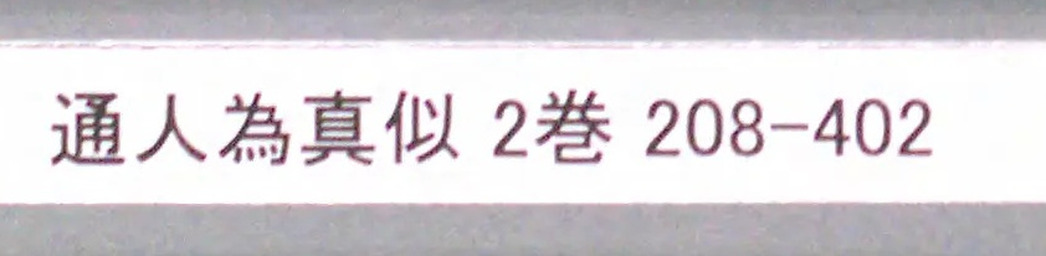通人為真似全

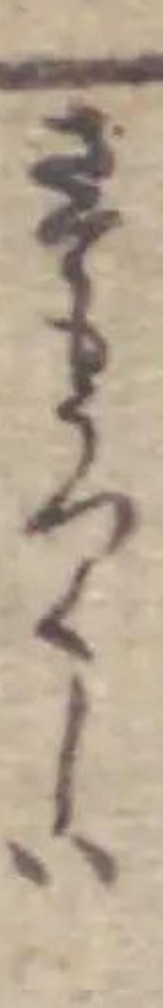さてもうつくしい

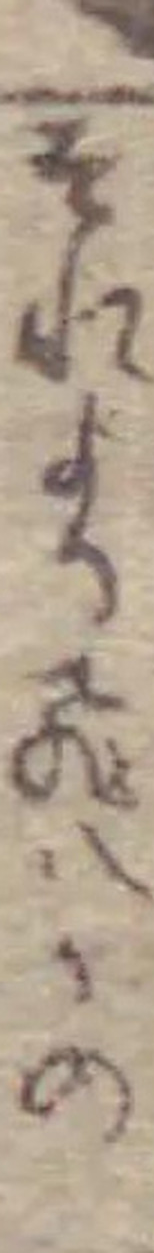それより飛八かの
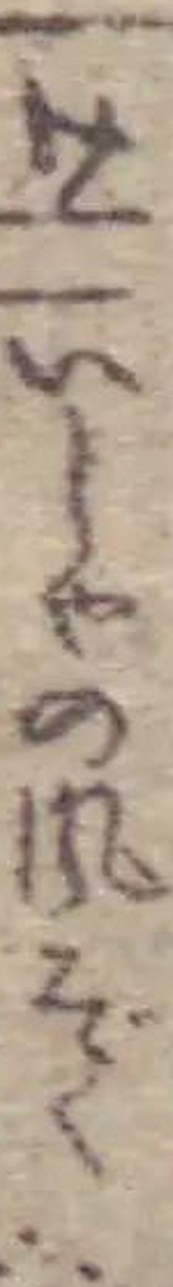けいしやの風ぞく
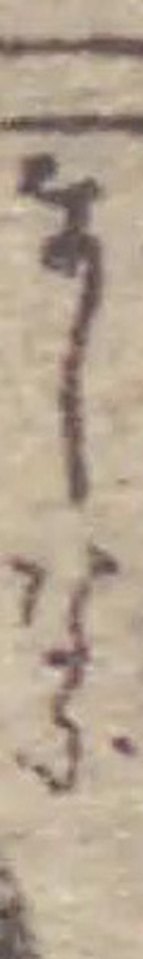ましなに
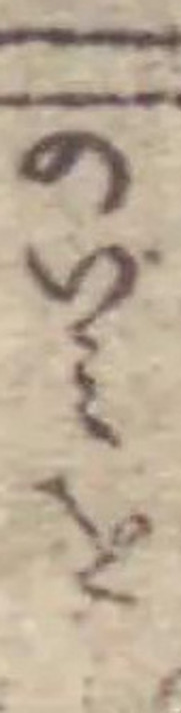のいみを
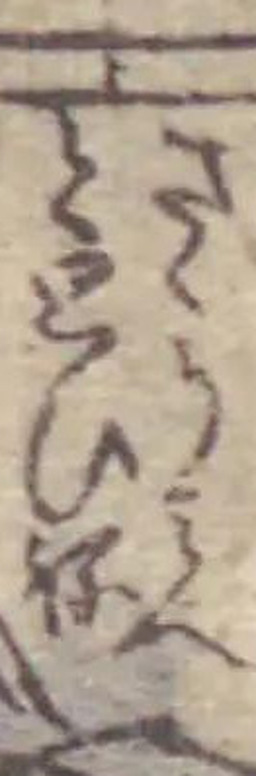と思ひね
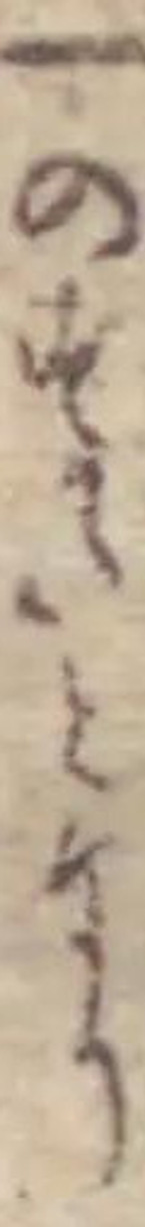のすかたとなり
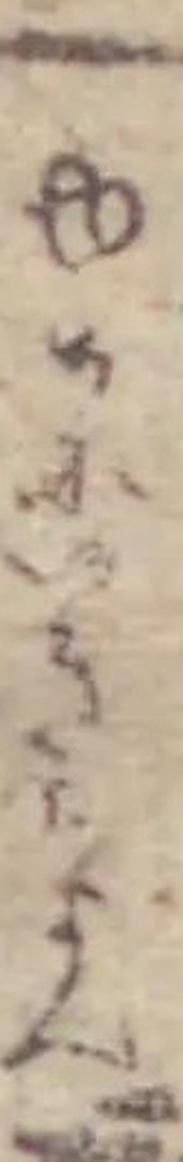ゆめにいきちよ人
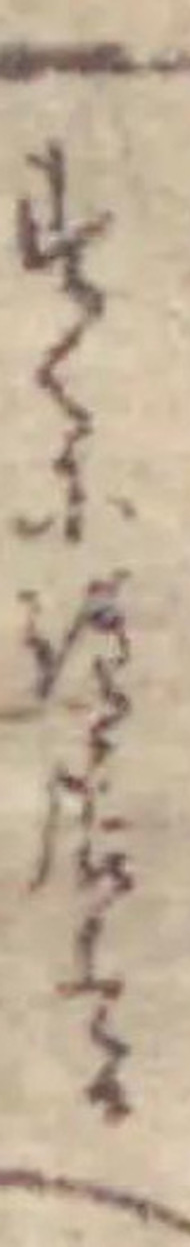すくに起居する
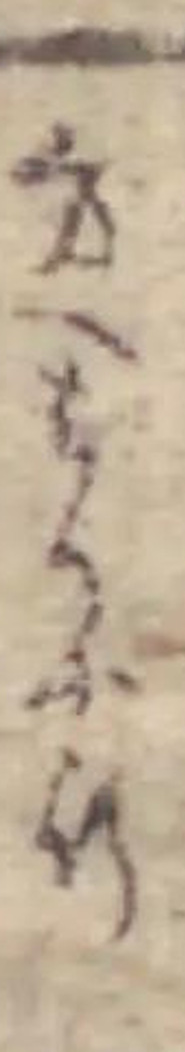方へはりに行
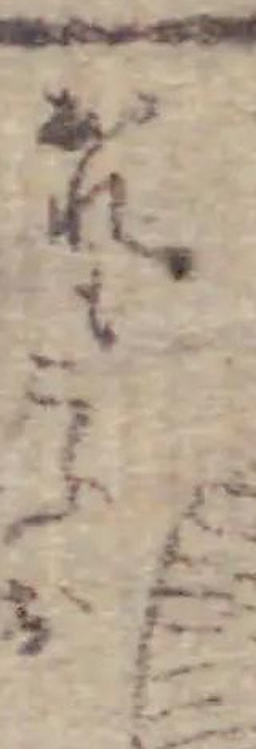おれもこふ出
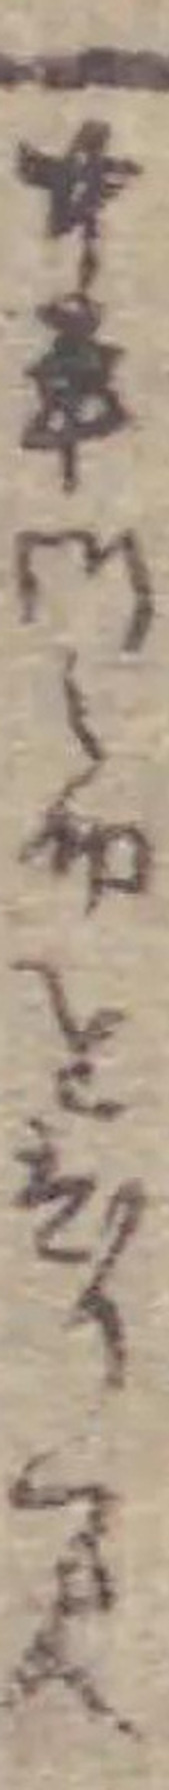中車門之助をひりなん
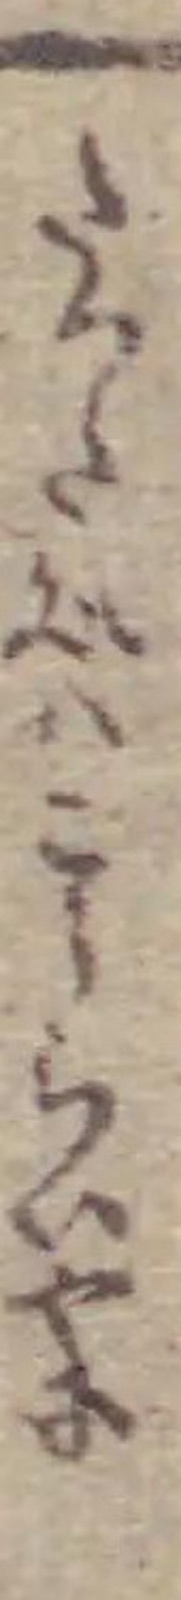たつた処はこうらいやに
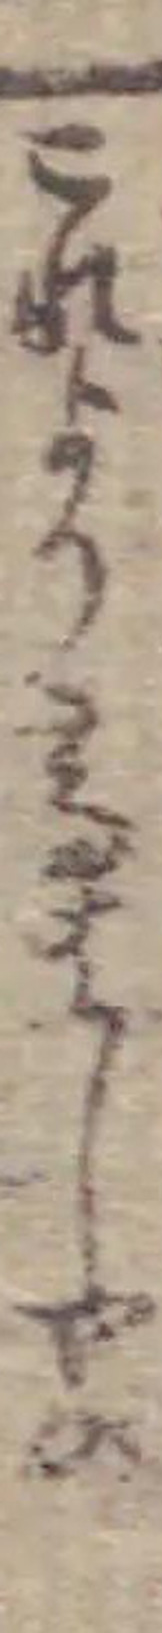これより高はしやか
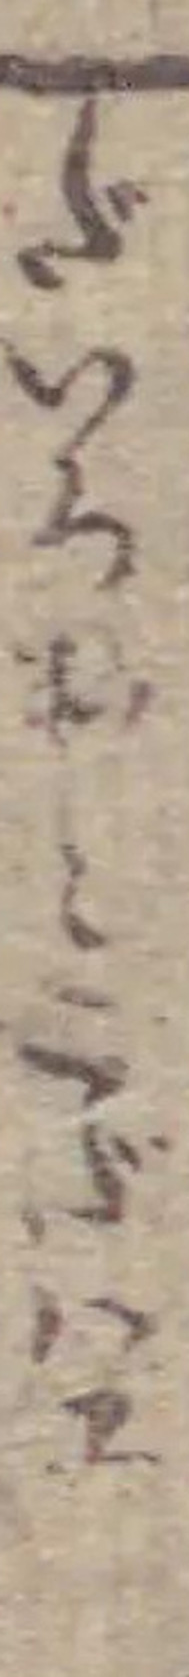だいろおとこだはヱ
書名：通人為真似 2巻
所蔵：国立国会図書館 National Diet Library, JAPAN
